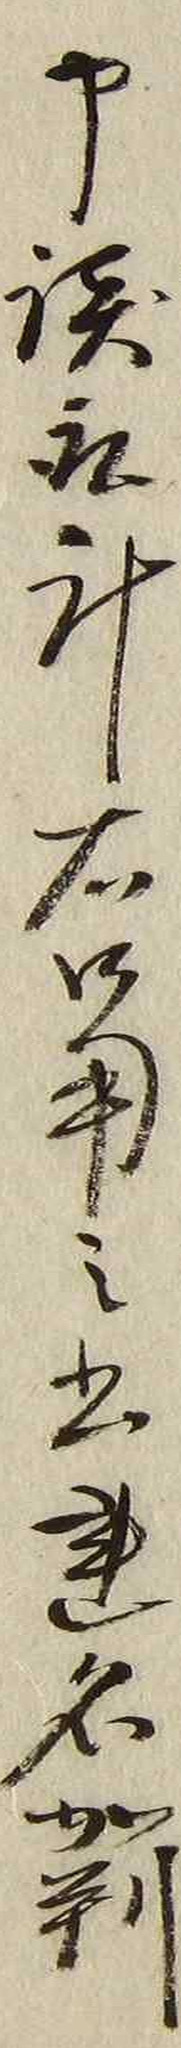申談取計右御用之書連名加判

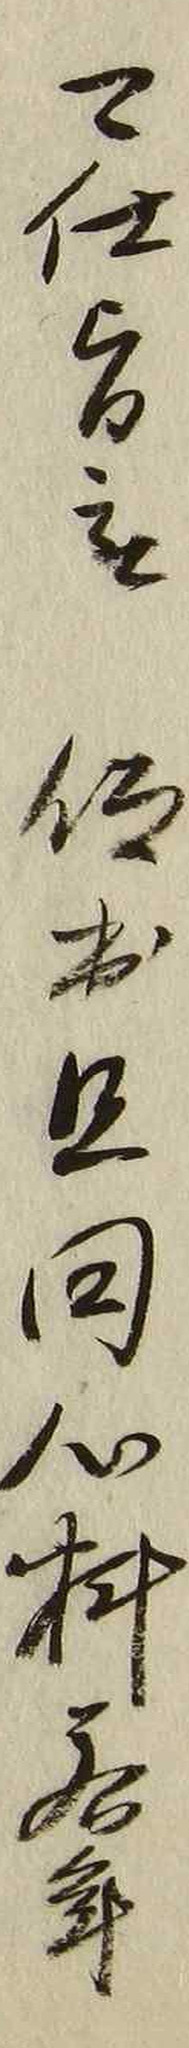可仕旨被仰出且同心料若年
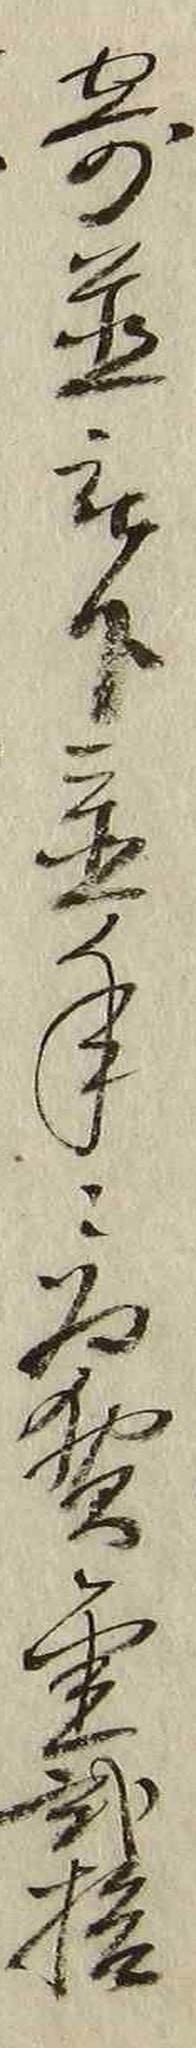寄並被下置年々為費金弐拾
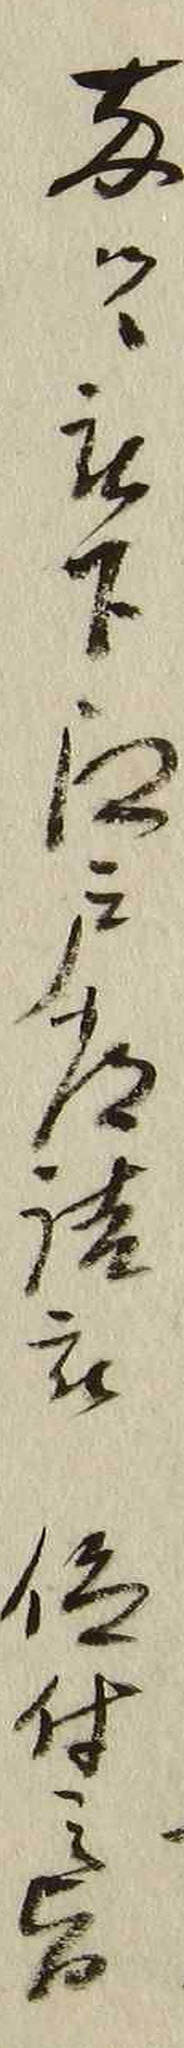両ツヽ被下江戸常詰被仰付之旨
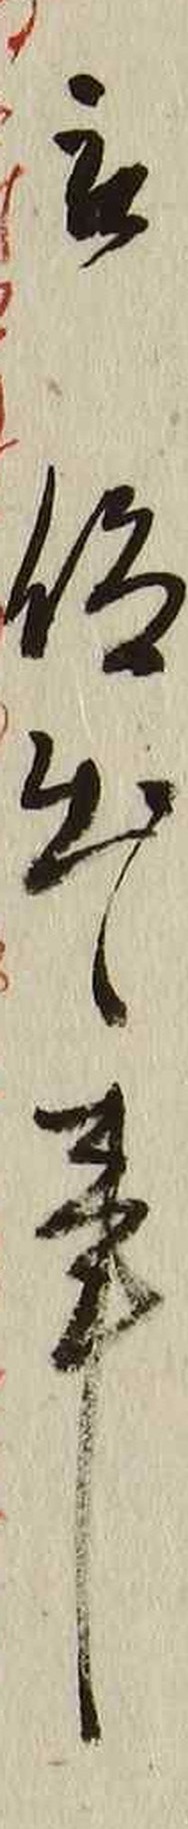被仰出候事
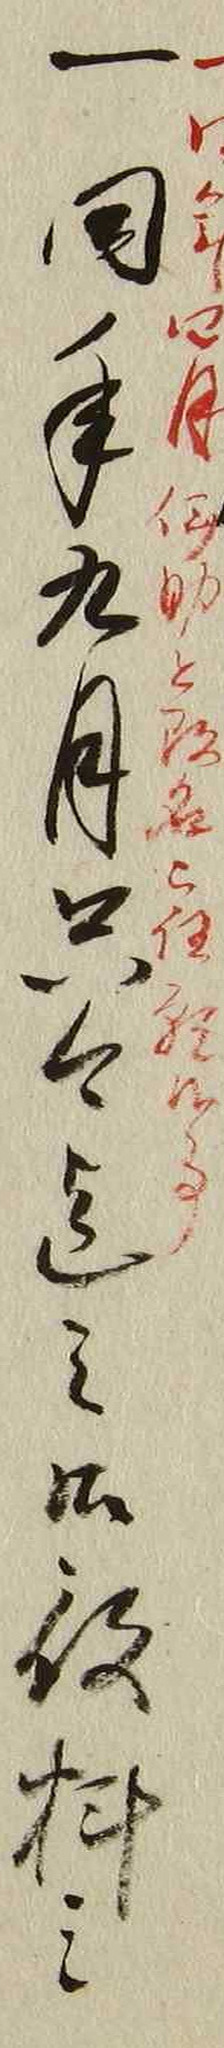一同年九月只今迄之御役料之
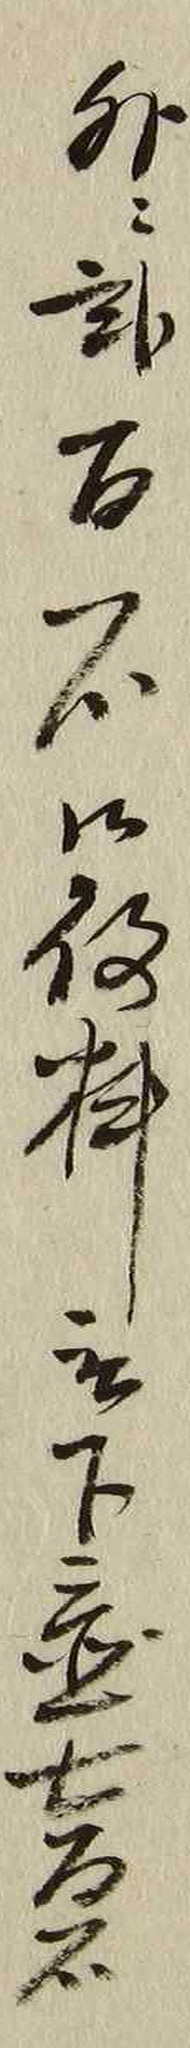外ニ弐百石御役料被下置七百石
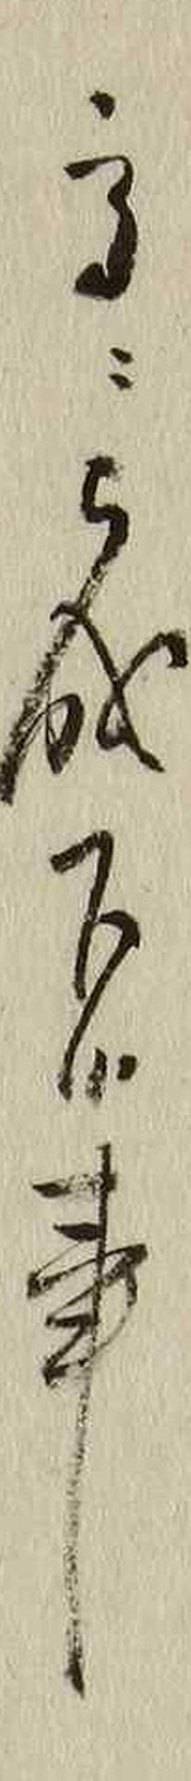高ニ被成下候事
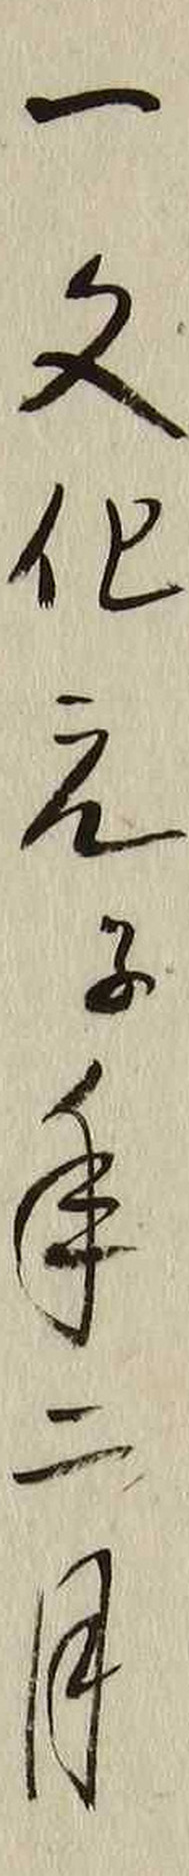一文化元子年二月
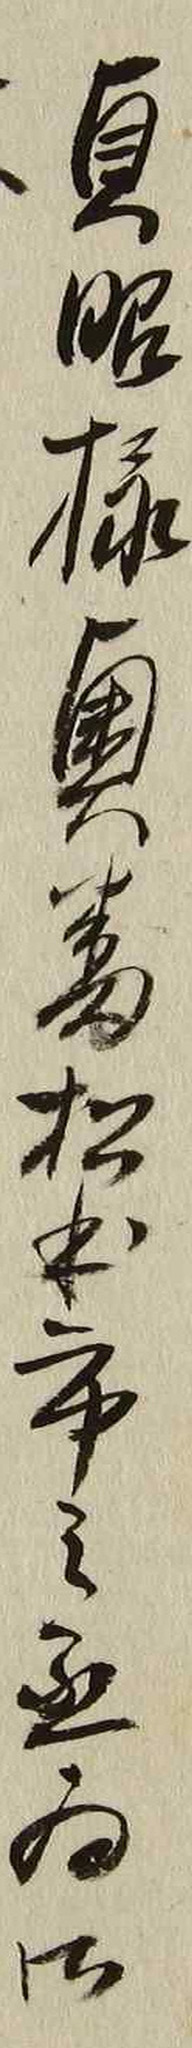貞昭様奥番松本市之丞為御
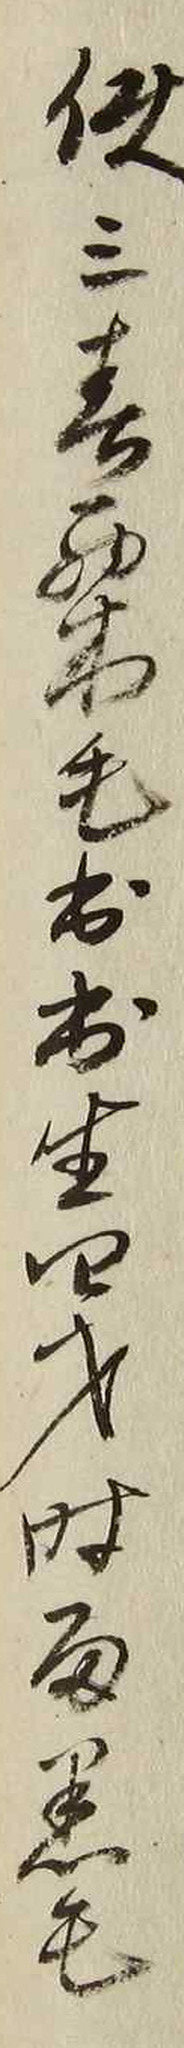使三春栗毛出出生四才時雨黒毛
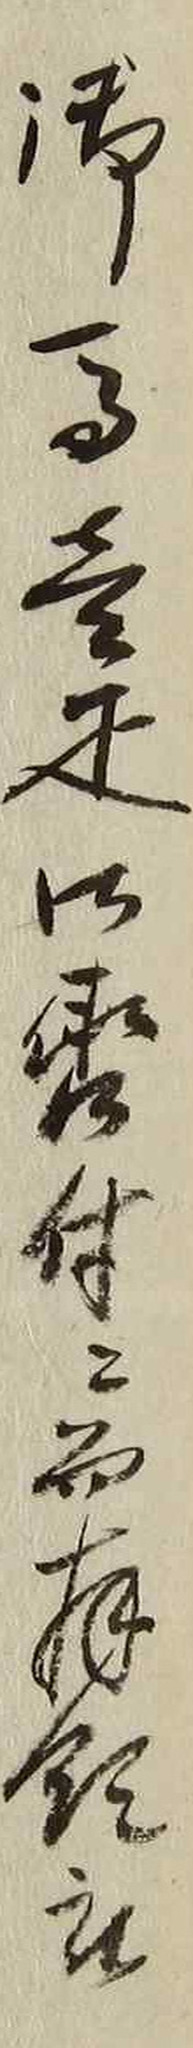御馬壱疋御轡付ニ而拝領被
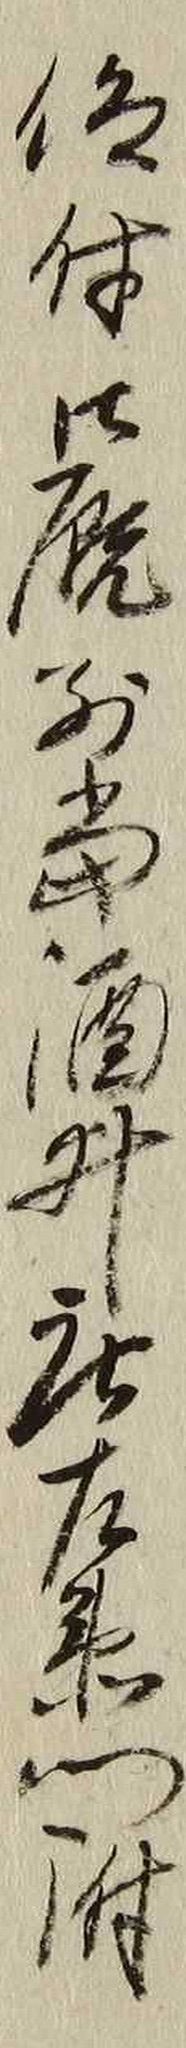仰付御厩別当酒井庄左衛門附
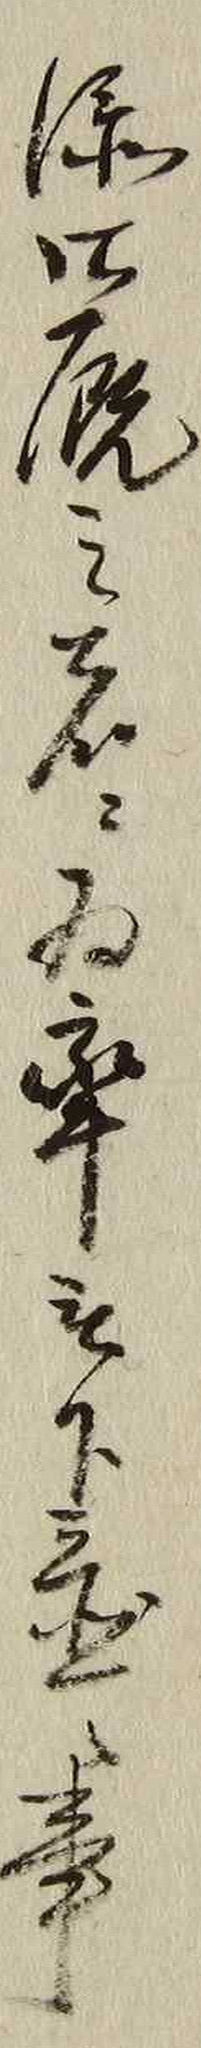添御厩之者ニ為率被下置候事
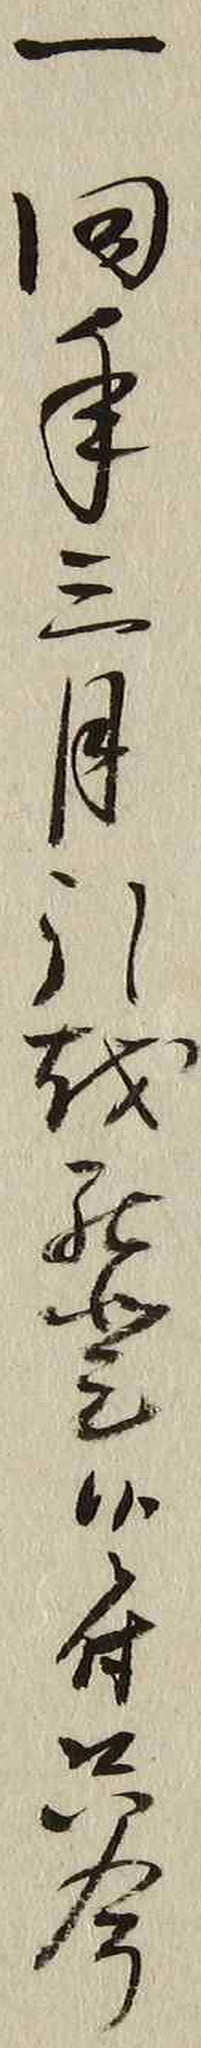一同年三月引越罷登候ニ付只今
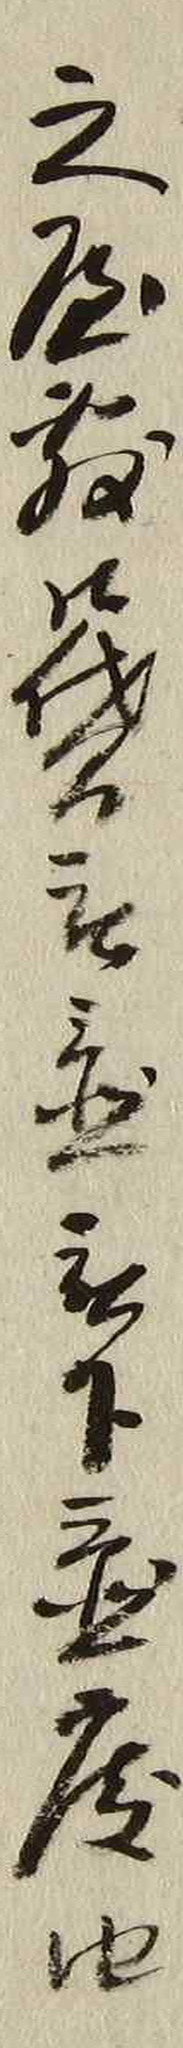之屋敷御貸被置被下置度由
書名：諸士系譜　巻之351　す之部1
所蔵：会津若松市立会津図書館
